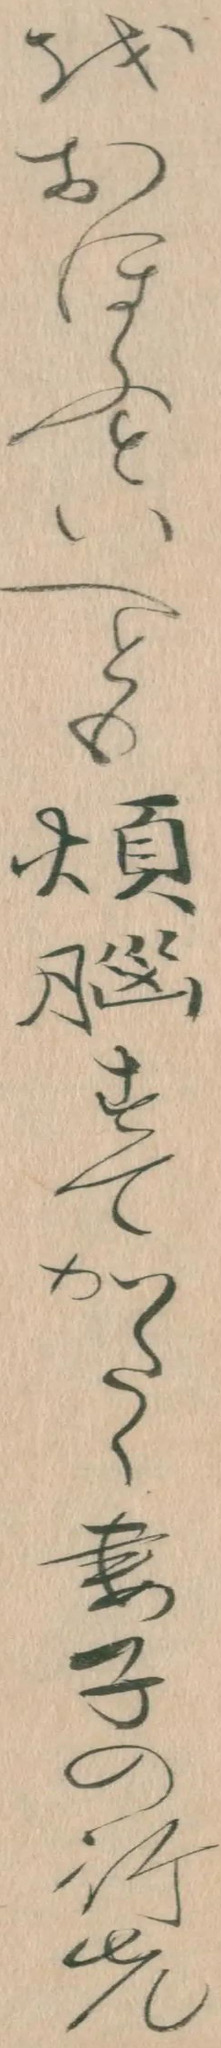をおほふといへとも煩脳すてかたく妻子の行先
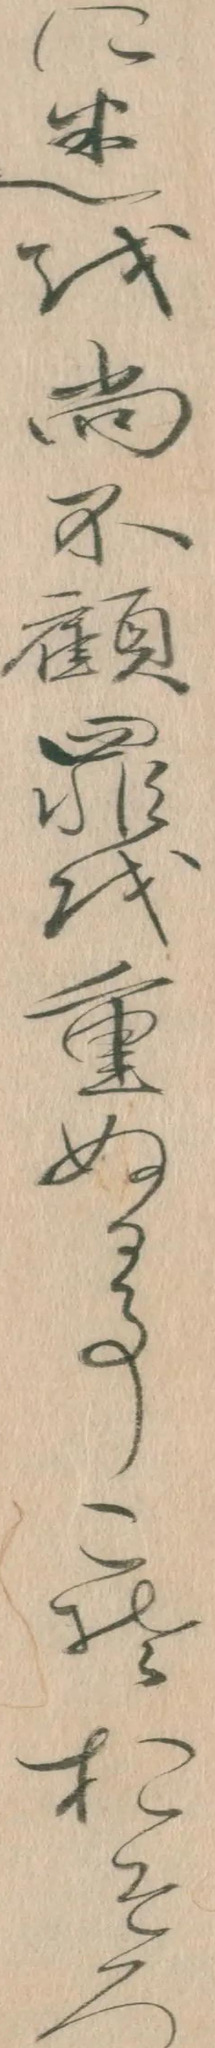に迷を尚不顧罪を重ぬる事こそおそろ
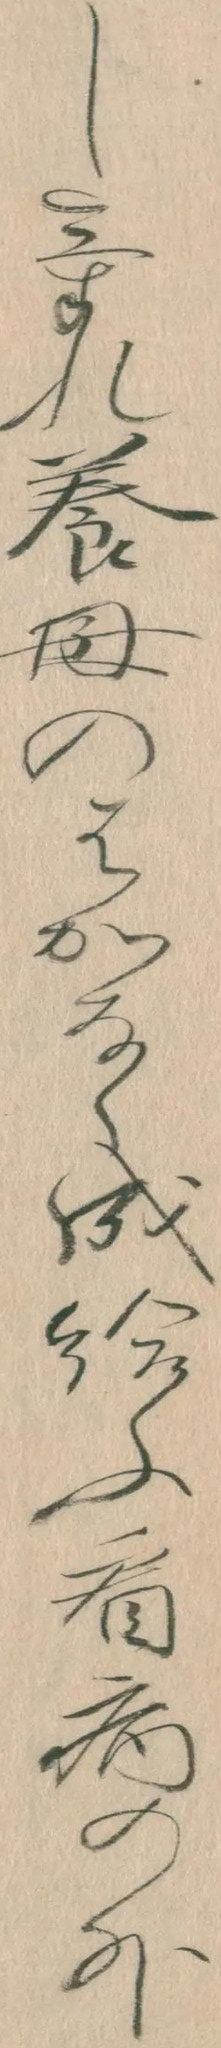しけれ養母のはかなく成給ふ看病の外
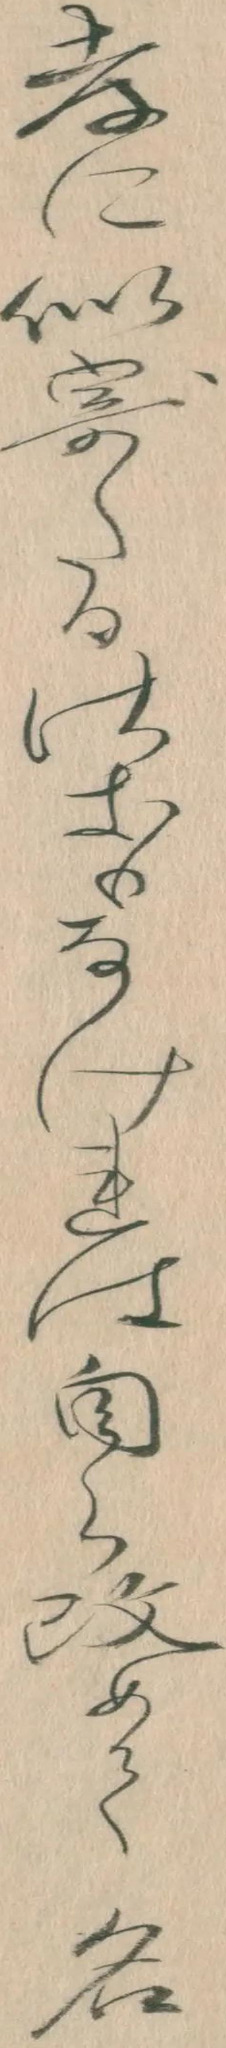孝に似寄たるさまもなけれは自ら改めて名
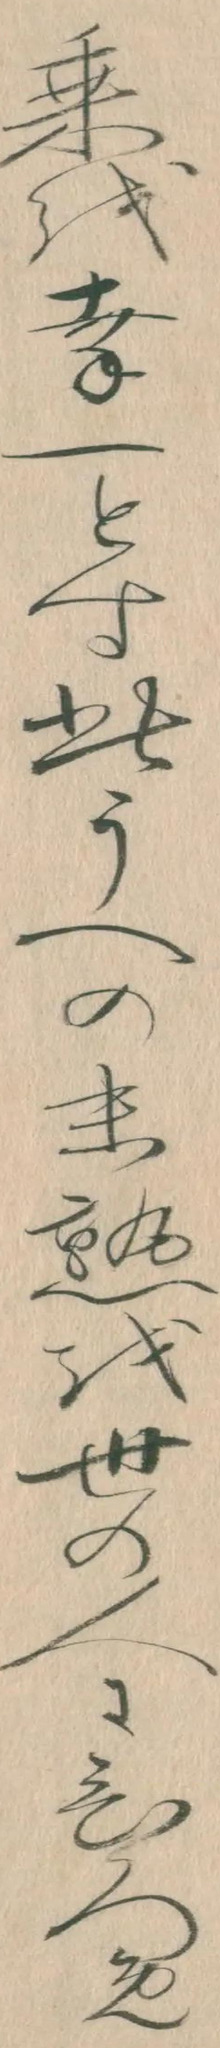乗を幸一とす此うへの未熟を世の人にひろめ
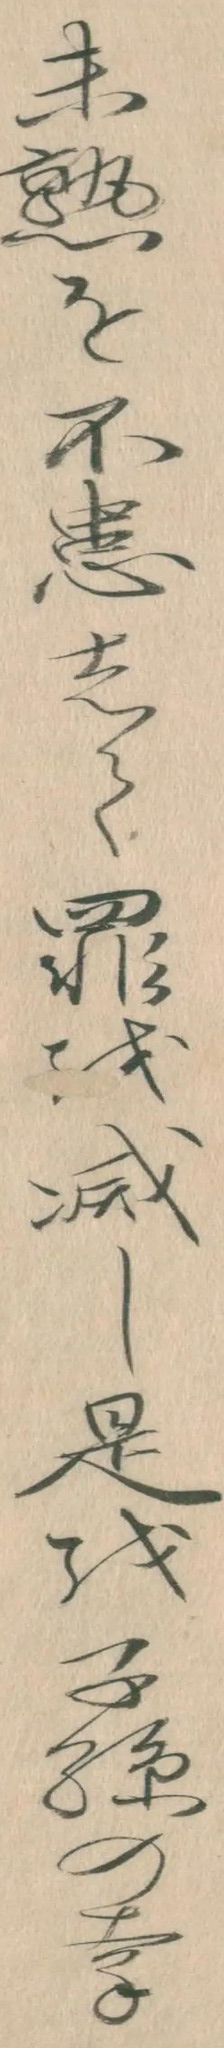未熟を不患して罪を滅し是を子孫の幸
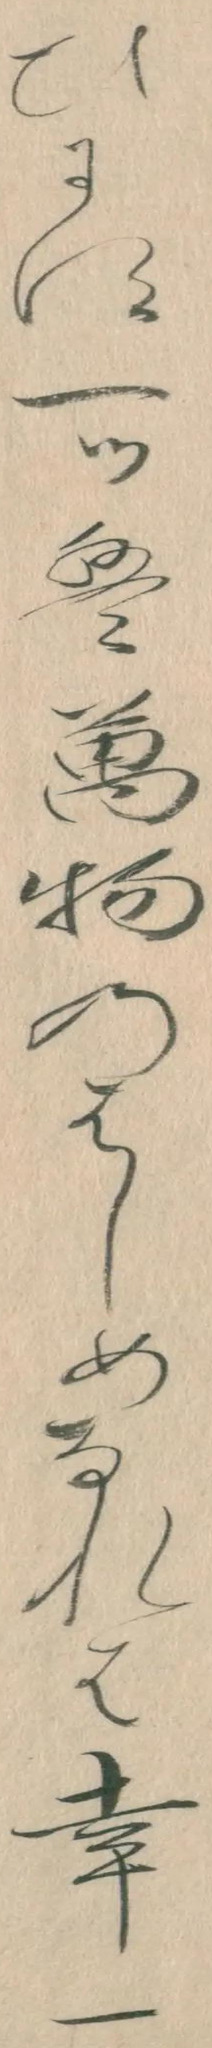ひにす一ツは万物のはしめなれは幸一

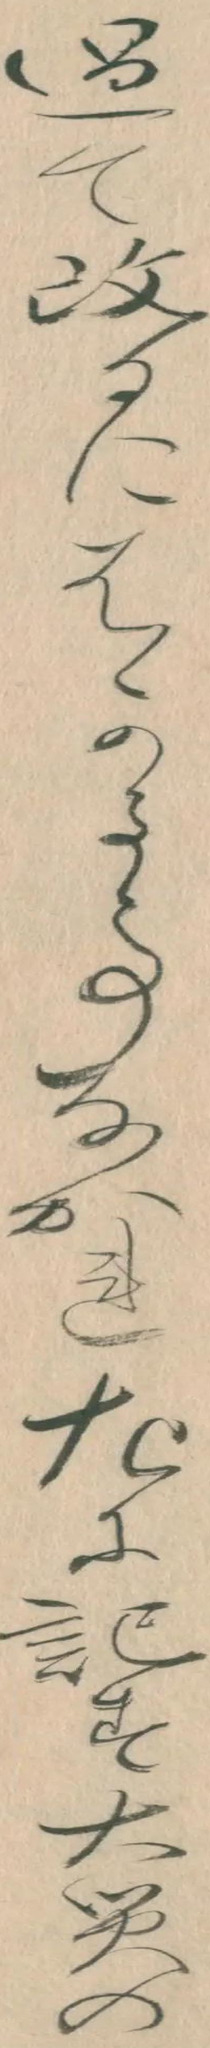過て改るにはゝかる事なかれ左に記す大災の
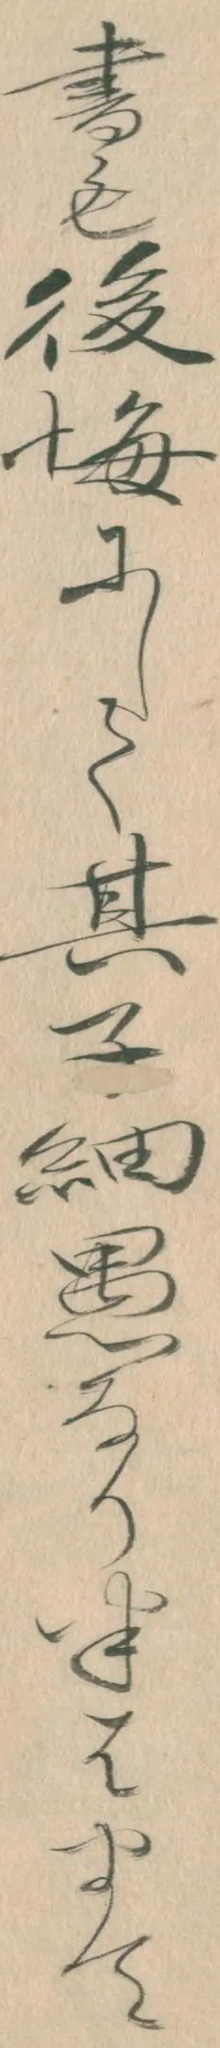書も後悔にして其子細愚なり半はまて
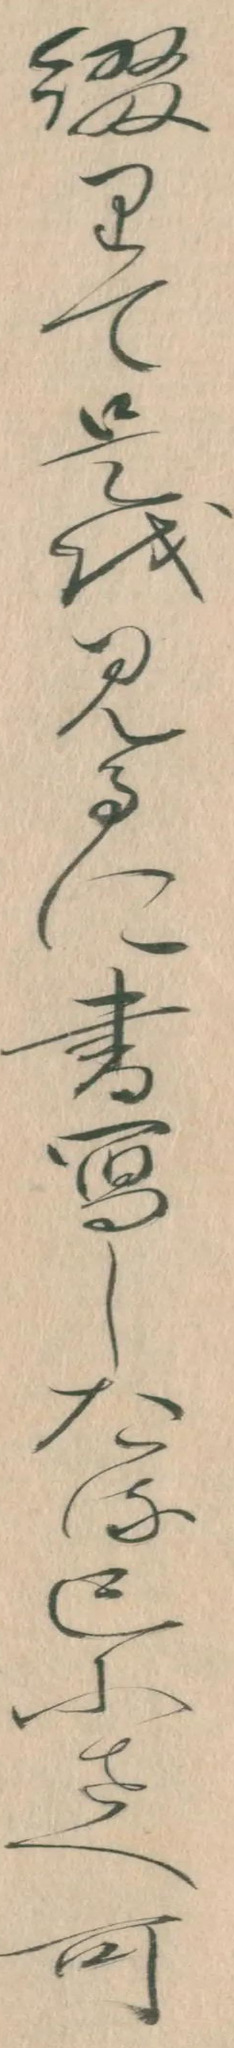綴りて是を見るに書写したる己にさへ可
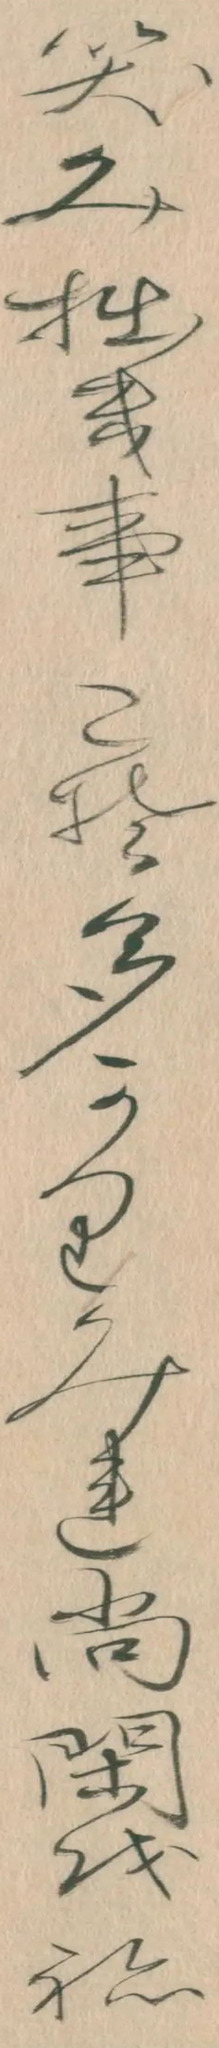笑み拙き事こそ多かりけれ尚閑をね
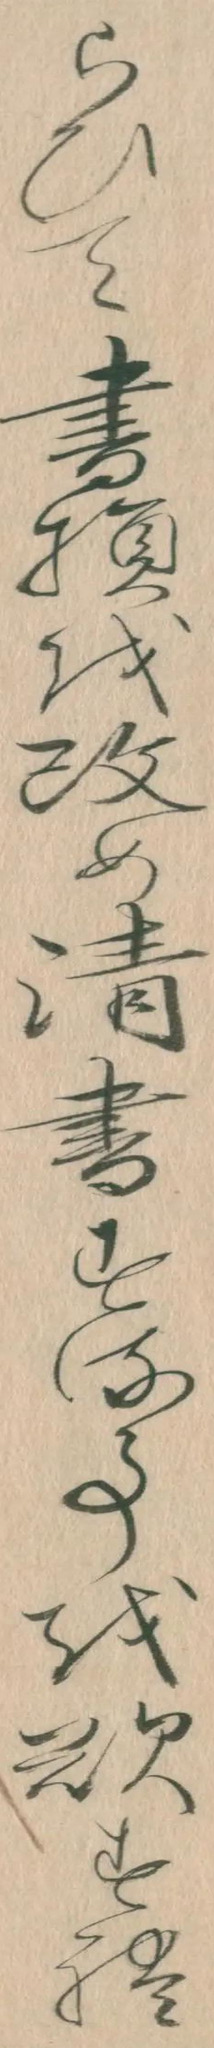らひて書損を改め清書する事を欲すれ
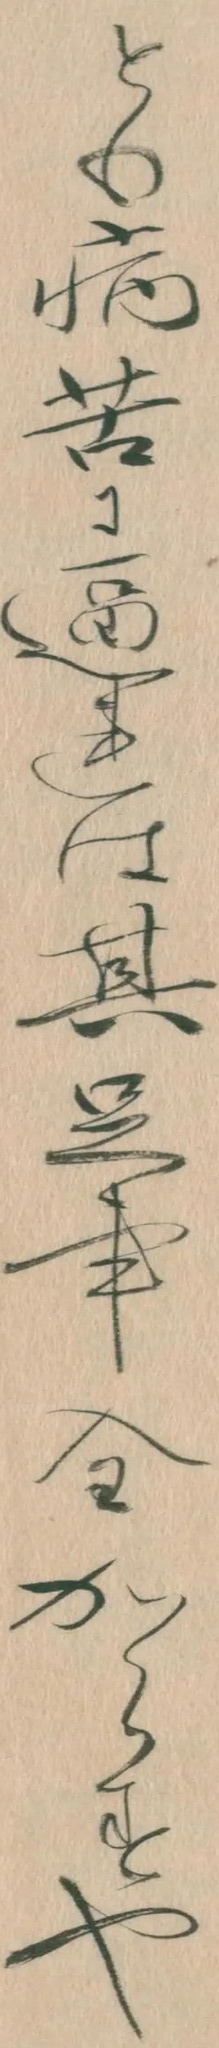とも病苦に逼れは其足事全からすや
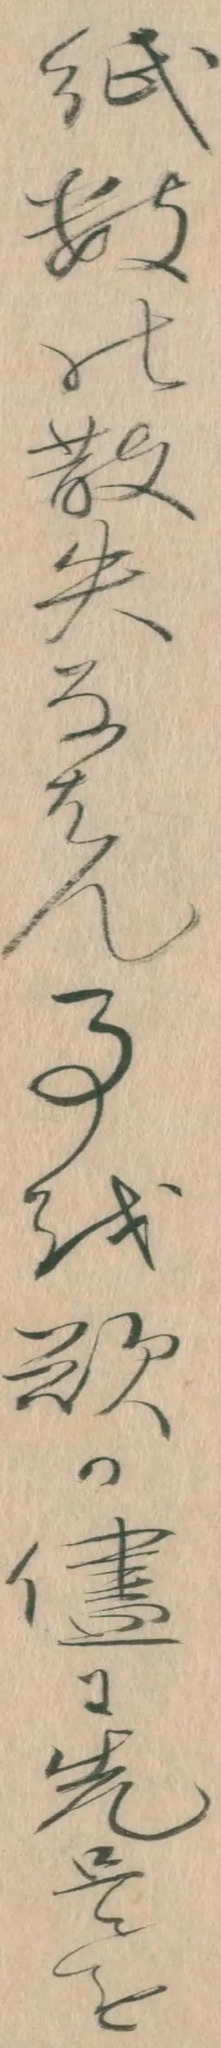紙数の散失なはん事歎か儘に先是を
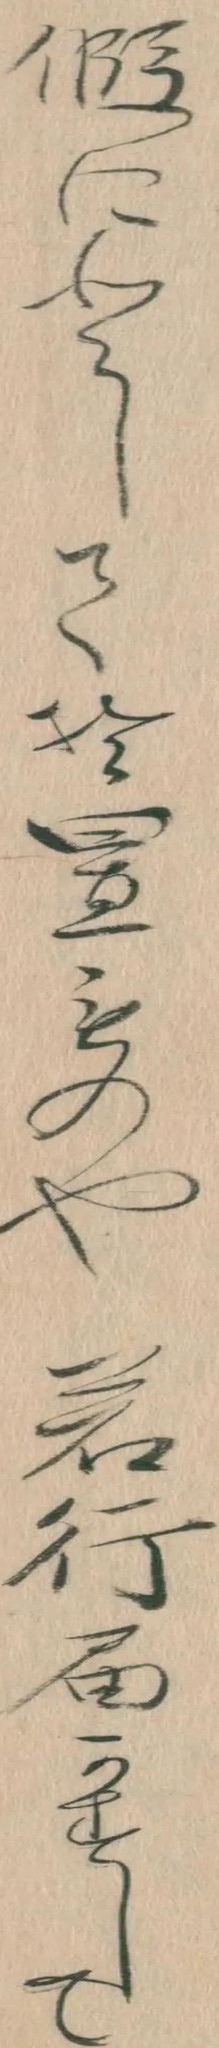仮にとしてそ置ものや若行届かすして
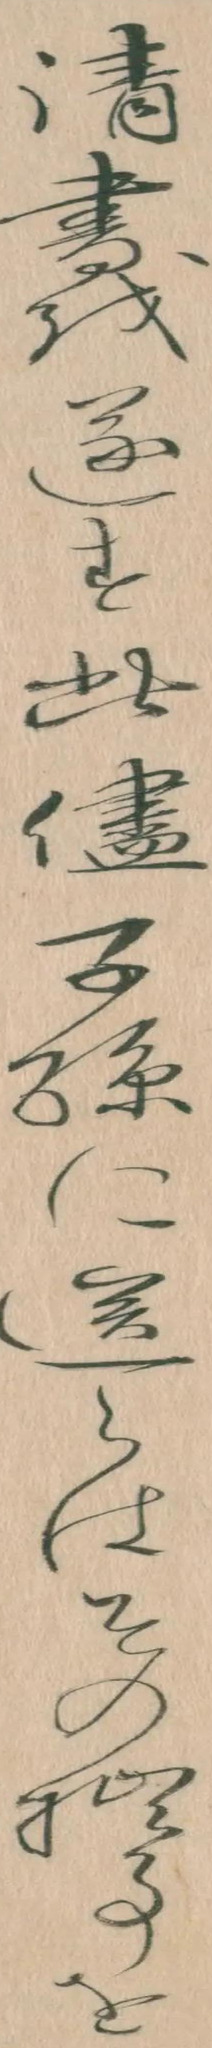清書を遂す此儘子孫に送らはその拙事を
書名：俗語之種. [1]
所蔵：国立国会図書館 National Diet Library, JAPAN
